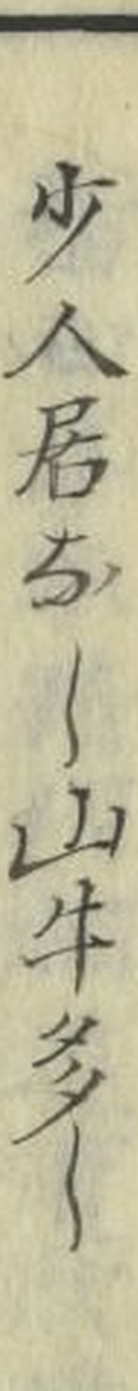少人居なし山牛多し
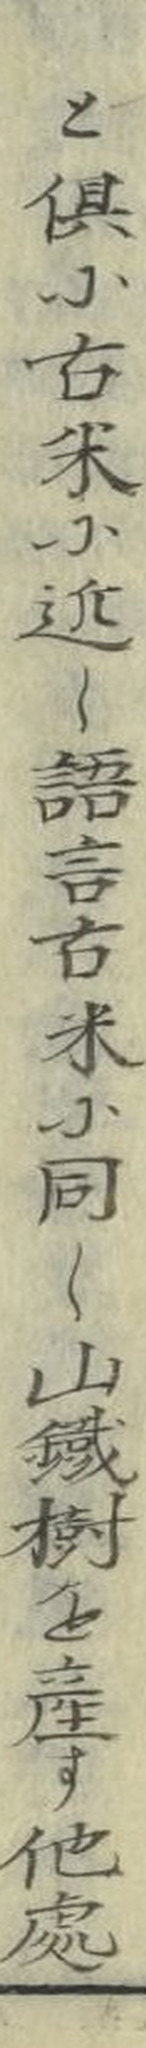と倶に古米に近し語言古米に同し山鉄樹を産す他処
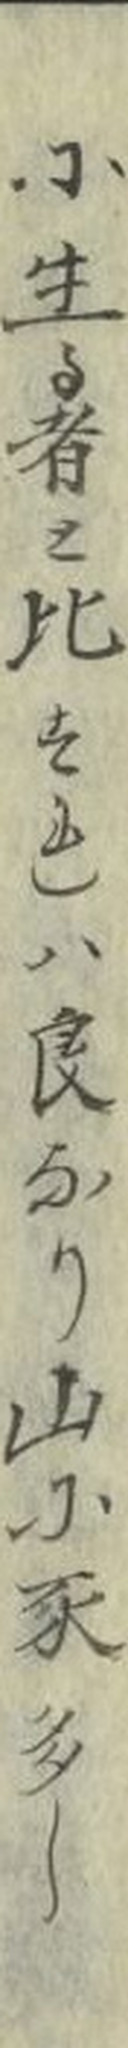に生る者と比すれは良なり山に豕多し
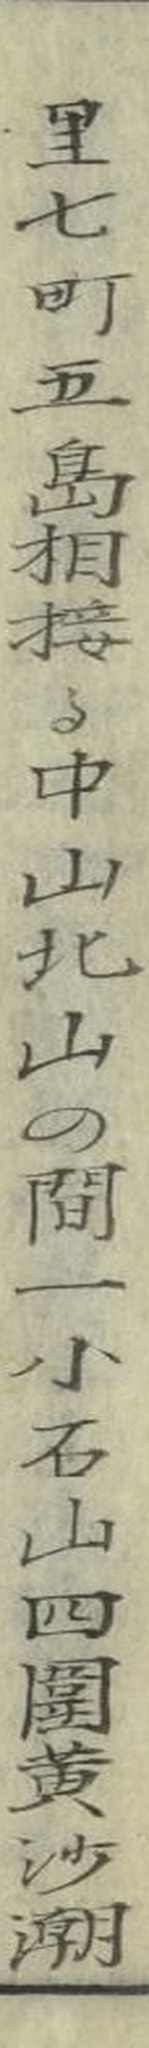里七町五島相接る中山北山の間一小石山四囲黄沙潮
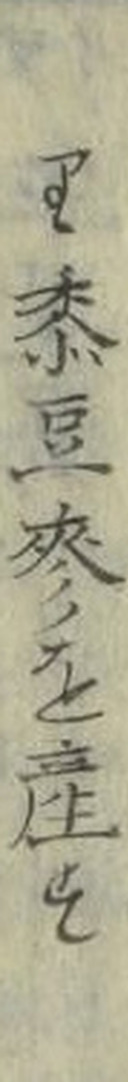り黍豆麦を産す

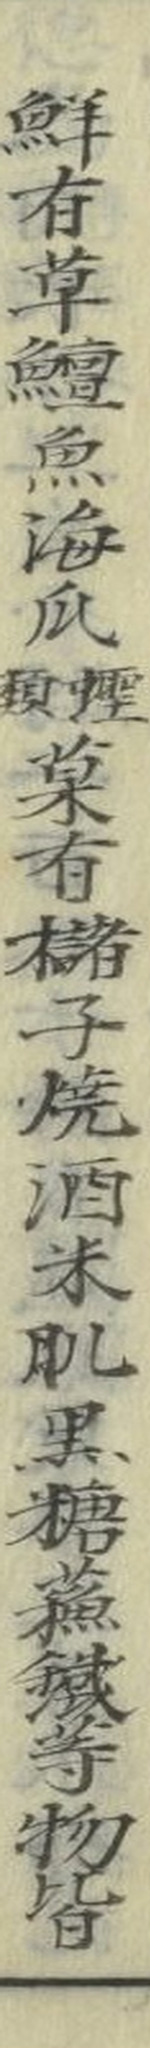鮮有草鱣魚海瓜蟶類菓有櫧子焼酒米肌黒糖蘓鉄等物皆
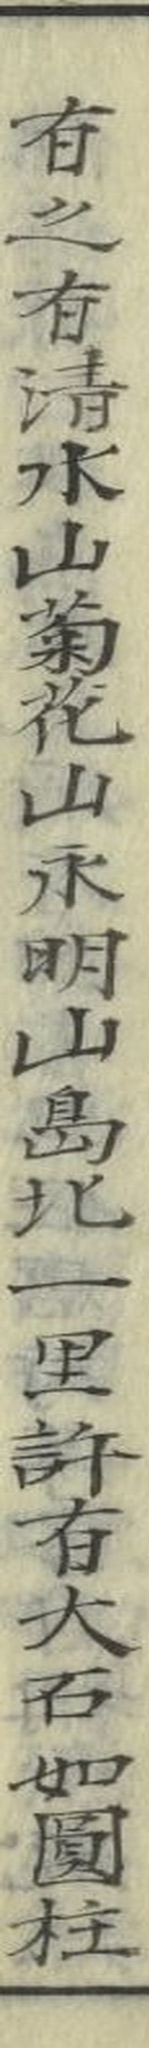有之有清水山菊花山永明山島北一里許有大石如円柱
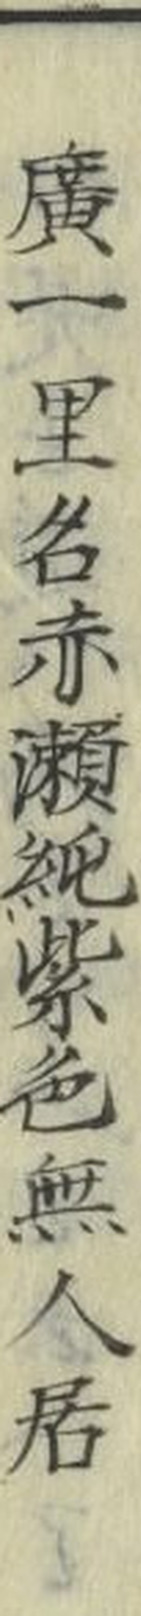広一里名赤瀬純紫色無人居
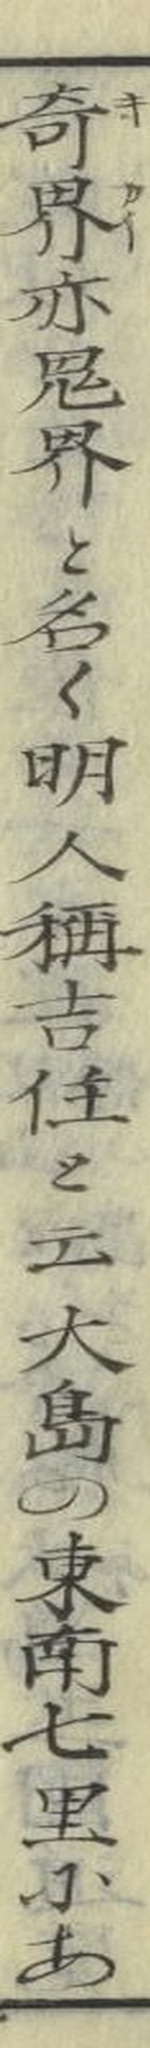奇界亦鬼界と名く明人称吉住と云大島の東南七里にあ
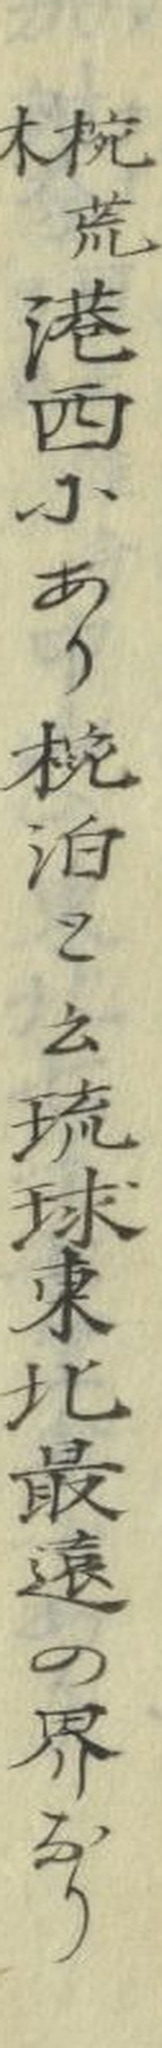椀荒木港西にあり椀泊と云琉球東北最遠の界なり
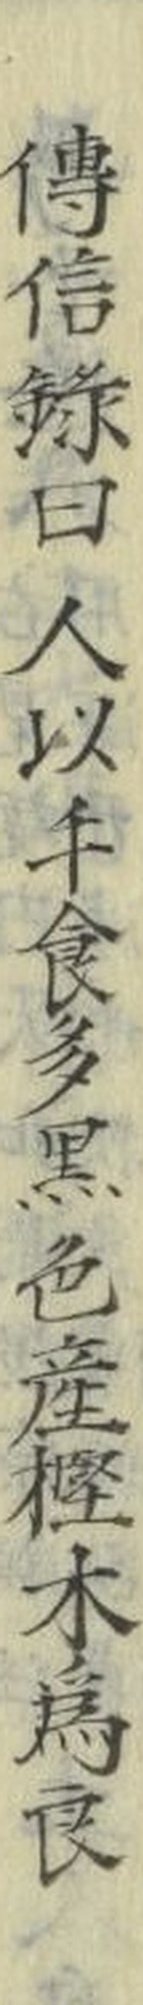伝信録曰人以牛食多黒色産樫木為良
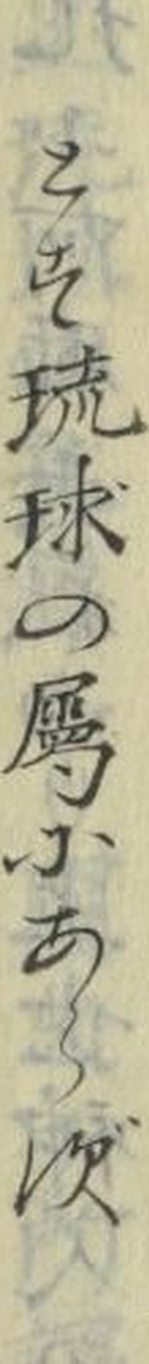とす琉球の属にあらず
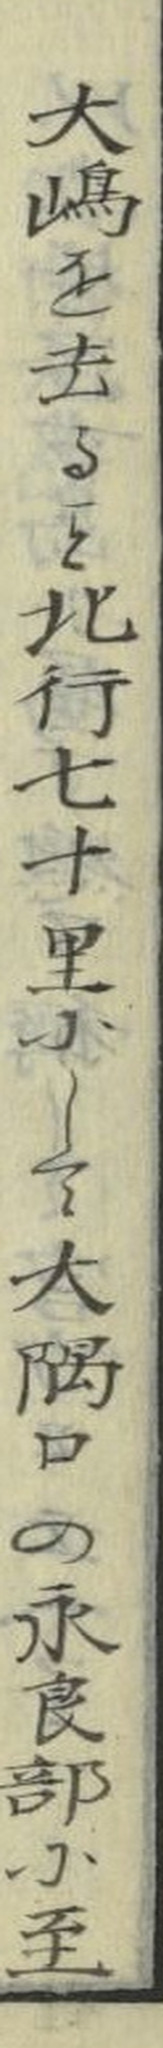大嶋を去ること北行七十里にして大隅口の永良部に至
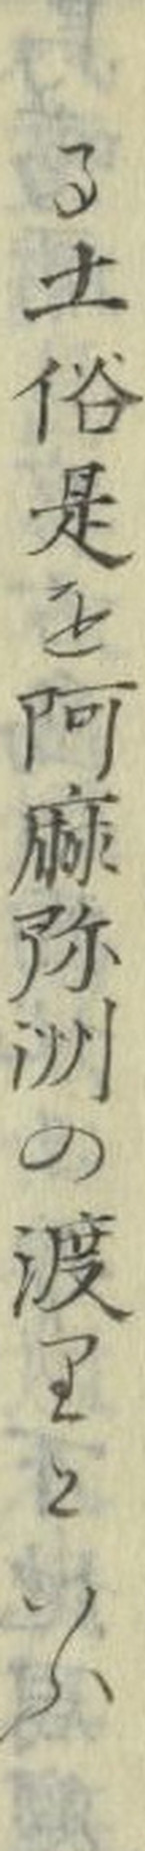る土俗是を阿麻弥洲の渡りといふ
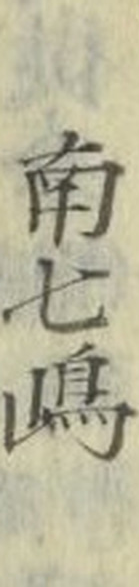南七嶋
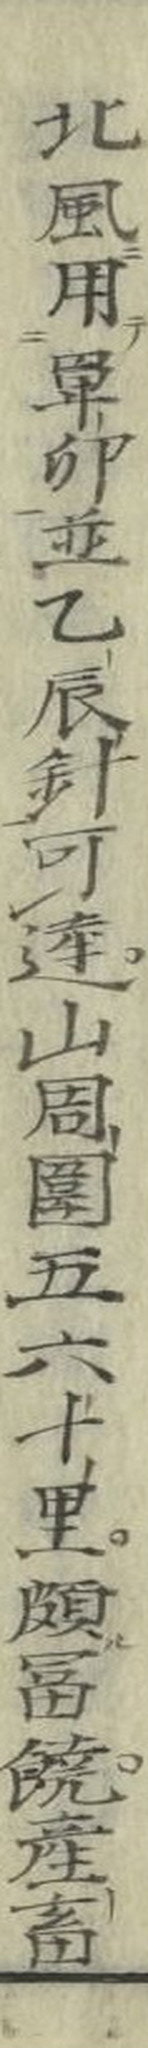北風用單-卯並乙-辰-針可達。山周-囲五六-十-里。頗冨饒。産-畜
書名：琉球沿革志 上
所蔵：University of the Ryukyus Library
